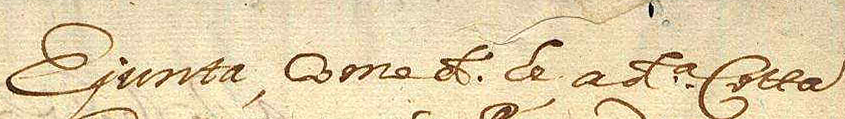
E junta, como d̄.o he a d̄t.a Cotta
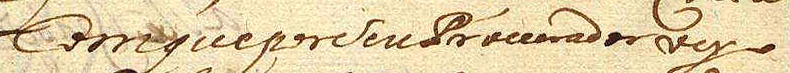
com que por seu Procurador veyo
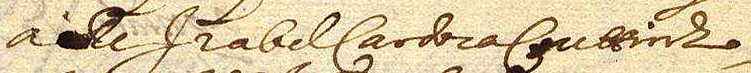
a Re Jzabel Cardoza Couttinho
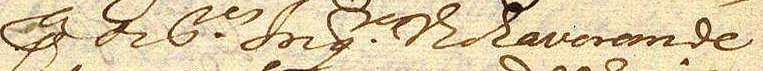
p.a os s.res Inq.res lhe haverem de
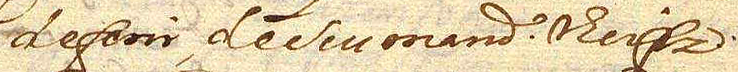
deferir de seu mand.o lhe fiz
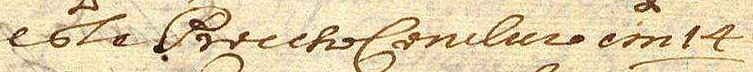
este Processo Concluzo em 14
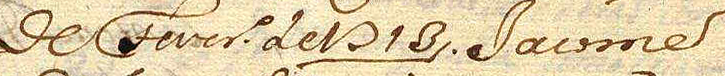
de Fever.o de 1713. Iacome
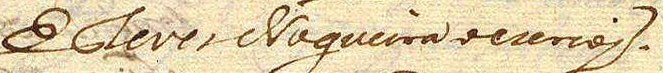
Esteves Nogueira o escrevj.
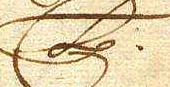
CLo.
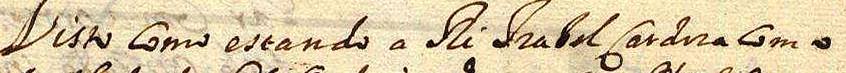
Visto como estando a Ré Izabel Cardoza com o
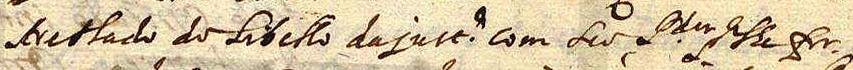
treslado do Libello da just.a com seo P.dor pa lhe for
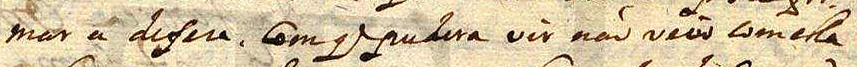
mar a defeza, Com q̄ pudera vir, naõ veio com ella
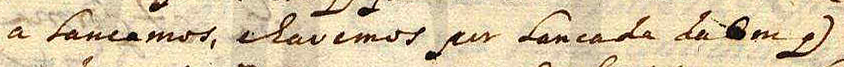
a Lançamos, e havemos per Lançada da em q̄
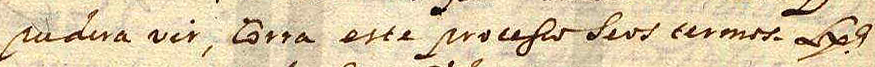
pudera vir, corra este processo seos termos Lx.a
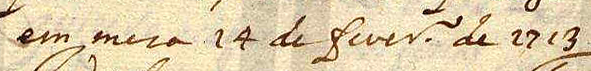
em meza 14 de fever.o de 1713
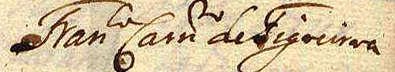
Fran.co Carn.ro de Figueiroa
